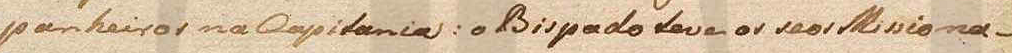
panheiros na Capitania: o Bispado teve os seos Missiona
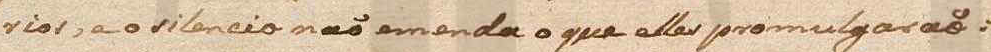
rios, e o silencio naõ emenda o que elles promulgaraõ:
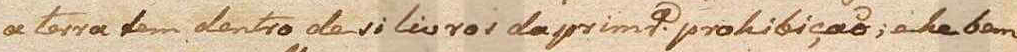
a terra tem dentro de si Livros da primr.a prohibiçaõ; e he bem
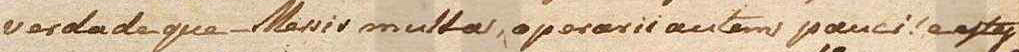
verdade que - Messis multa, operarii autem pauci! e estes
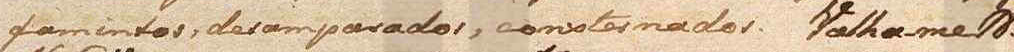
famintos, desamparados, consternados. Valha-me D.s
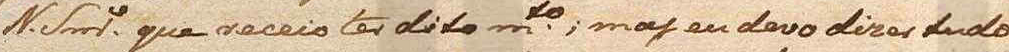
N. Snr̄.que receio ter dito m.to; mas eu devo dizer tudo
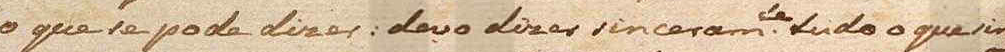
o que se pode dizer: devo dizer sinceram.te tudo o que sin
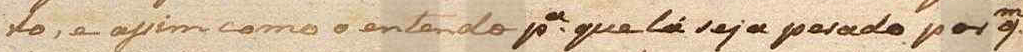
to, e asim como o entendo p.a que lá seja pesado por q.m
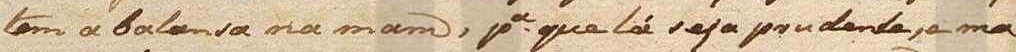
tem a balansa na mam, p.a que lá seja prudente, e ma
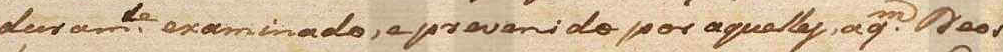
duramente examinado, e prevenido por aquelles, a q.m Deos
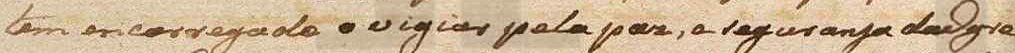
tem encarregado o vigiar pela paz, a seguransa da Igre
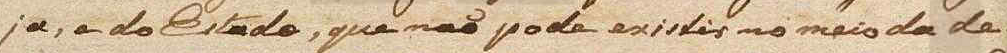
ja, e do Estado, que naõ pode existir no meio da de
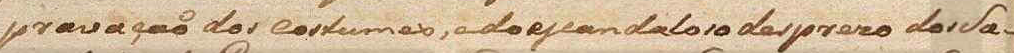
pravaçaõ dos costumes, e do escandaloso desprezo dos Sa
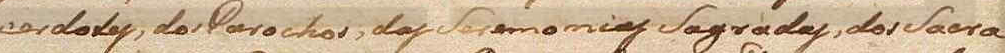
cerdotes, dos Parochos, das Seremonias Sagradas, dos Sacra
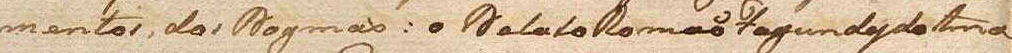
mentos, dos Dogmas: o Delato Romaõ Fagundes do Ama
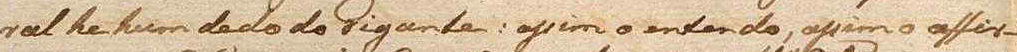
ral he hum dedo de Gigante: assim o entendo, assim o affir
